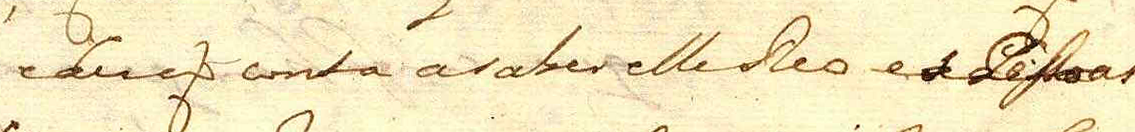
e deraõ conta a saber elle Reo e _ Pessoas
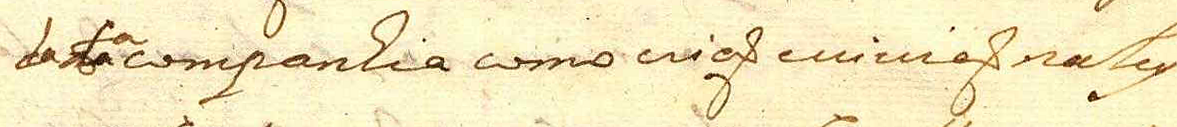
da d̄a companhia como criaõ e uiuiaõ na Ley
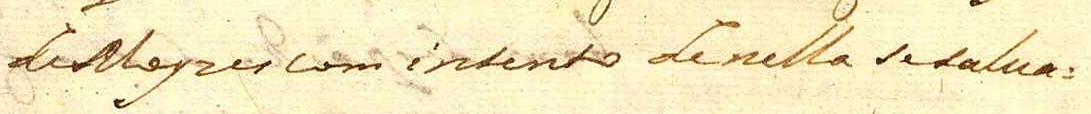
de Moyzes com intento de nella se salua
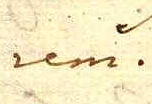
rem.
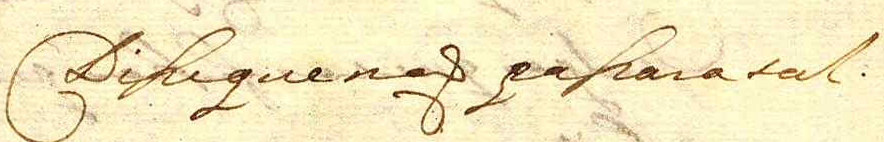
Disse que naõ passara tal.
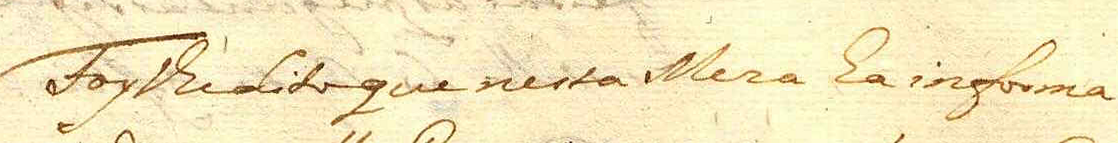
Foylhe dito que nesta Meza ha informa
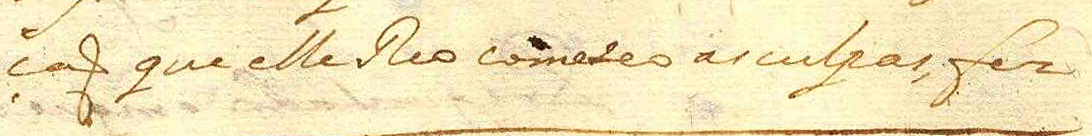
çaõ que elle Reo cometeo as culpas, fez
